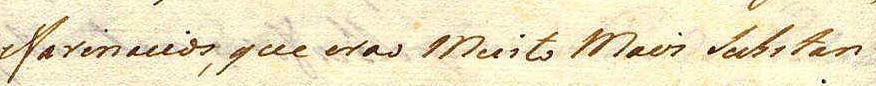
e farinacios, que erao Muito Mais substan
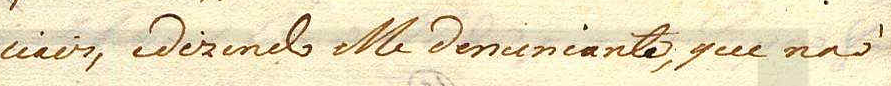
ciais, e dizendo elle denunciante, que naõ
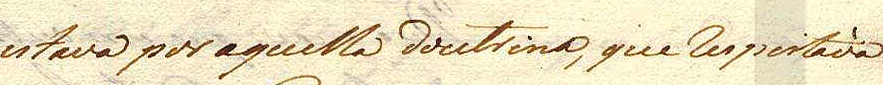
estava por aquella doutrina, que Respeitava
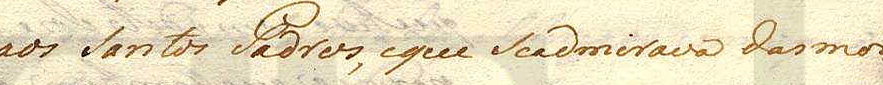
aos Santos Padres, e que se admirava das mor
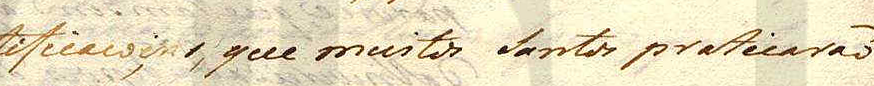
tificacoens, que muitos santos praticaraõ
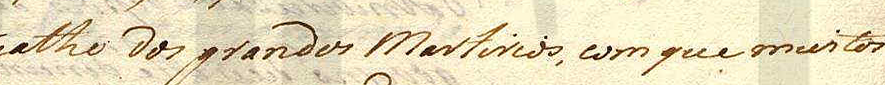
e athe dos grandes Martirios, com que muitos
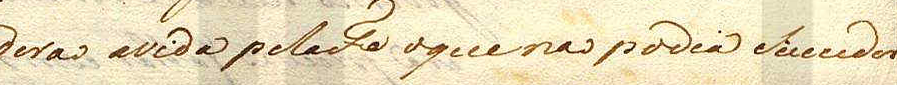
derao a vida pela Fe o que nao podia Succeder
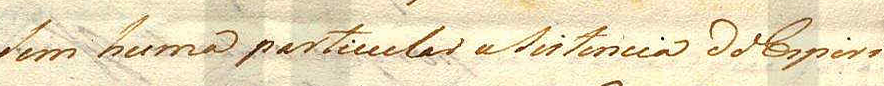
sem huma particular asistencia do Espiri
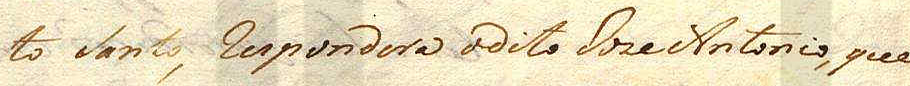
to Santo, Respondera o dito Ioze Antonio, que
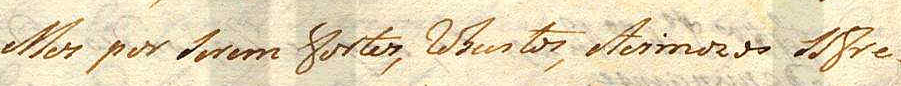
elles por serem fortes, Rebustos, e teimozos ssfre
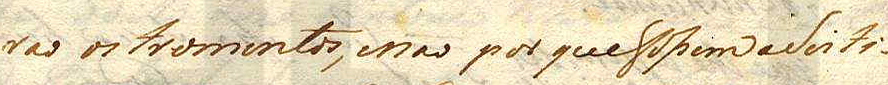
rao os tromentos, e nao por que fossem assisti
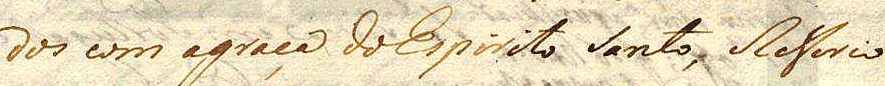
dos com a graça do Espirito santo, e Referio
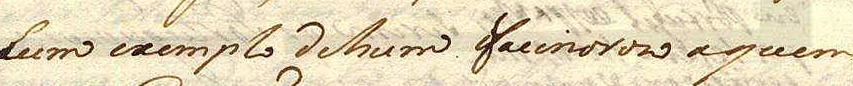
hum exemplo de hum facinorozo a quem
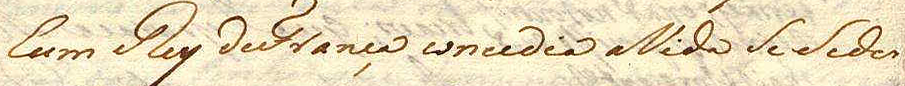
hum Rey de França concedia a Vida Se Sedes
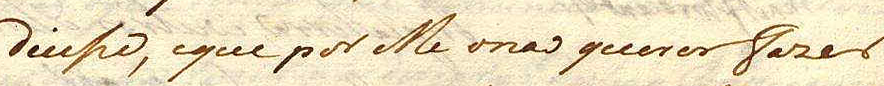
dicesse, e que por elle o nao querer Fazer
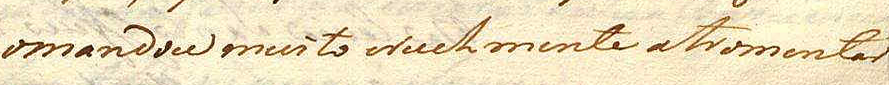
o mandou muito e reaLmente atromentar
